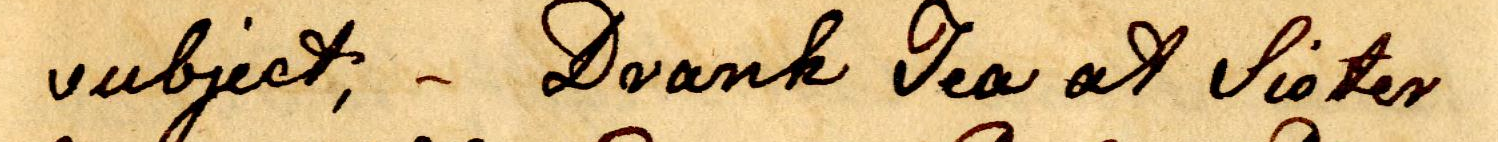subject,- Drank Tea at Sister
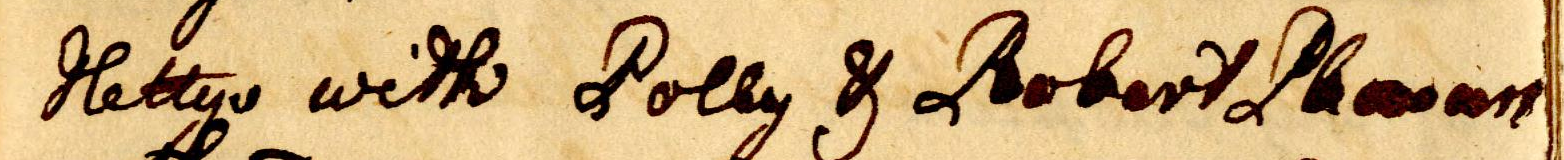Hettys with Polly & Robert Pleasant
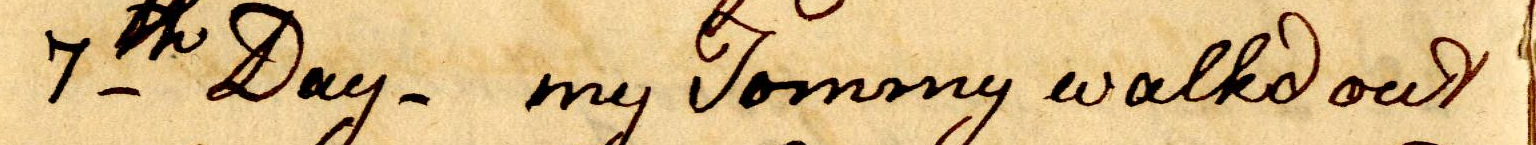7^th Day- my Tommy walkd out
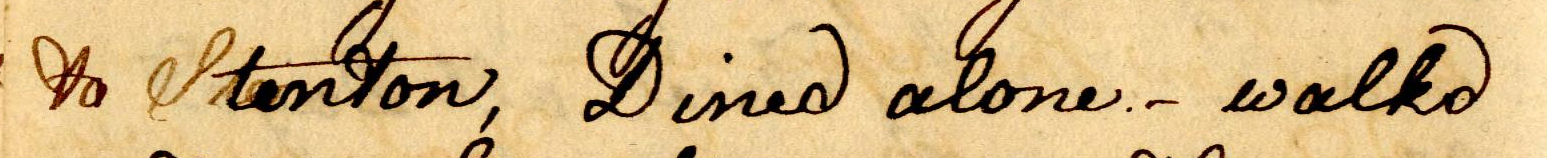to Stenton, Dined alone.- walkd
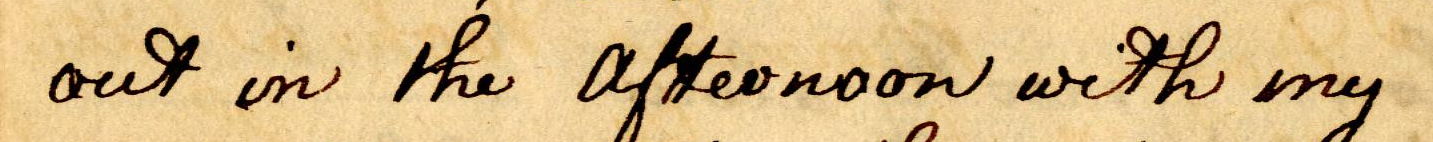out in the Afternoon with my
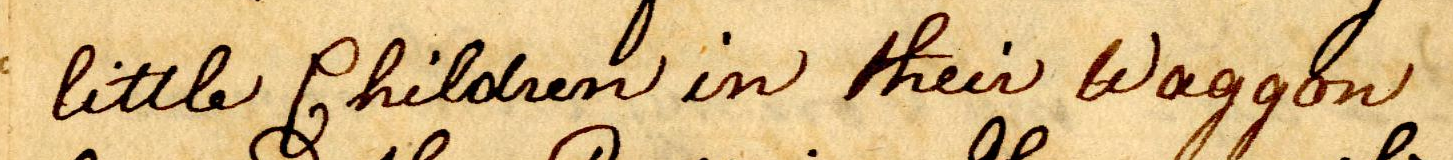little Children in their Waggon
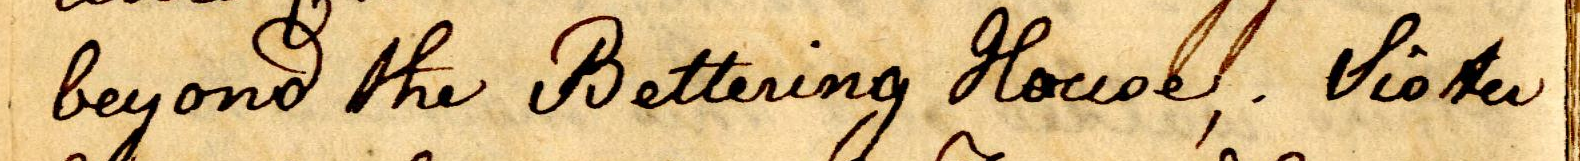beyond the Bettering House,- Sister
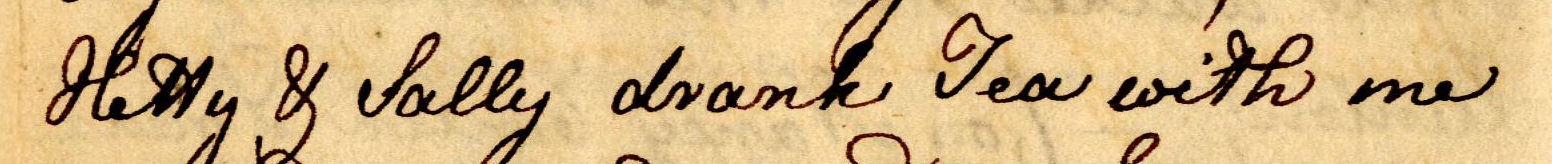Hetty & Sally drank Tea with me
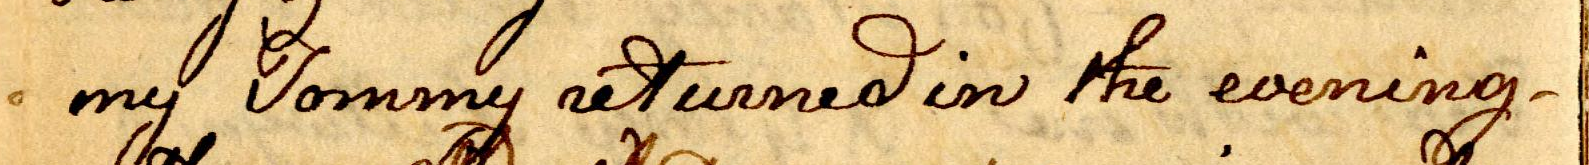my Tommy returned in the evening-
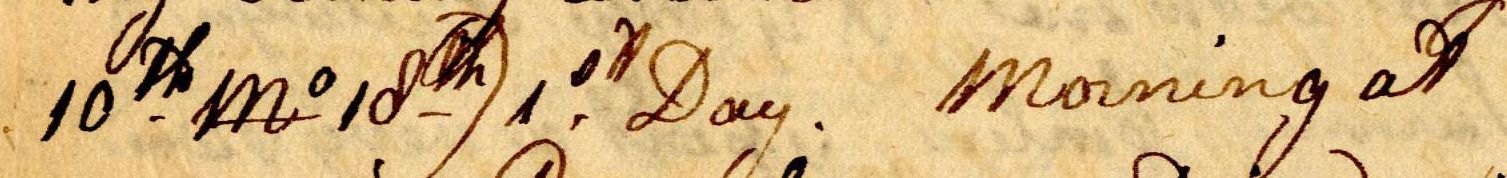10^th M^o 10^th) 1^st. Day . Morning at
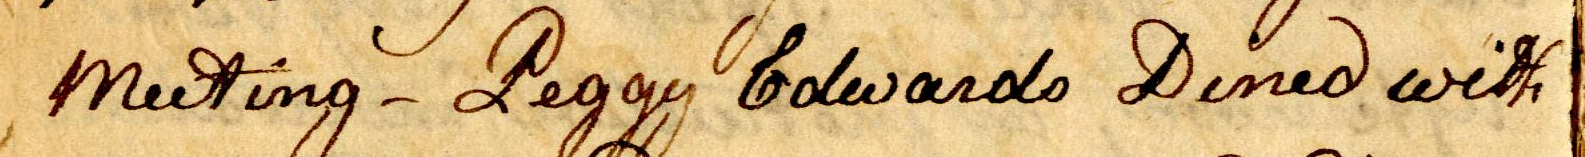Meeting- Peggy Edwards Dined with
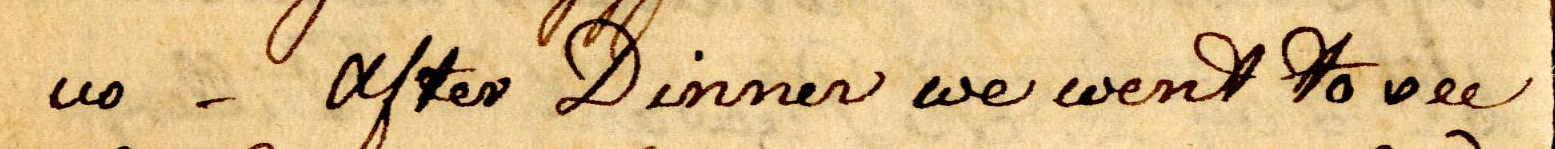us- After Dinner we went to see
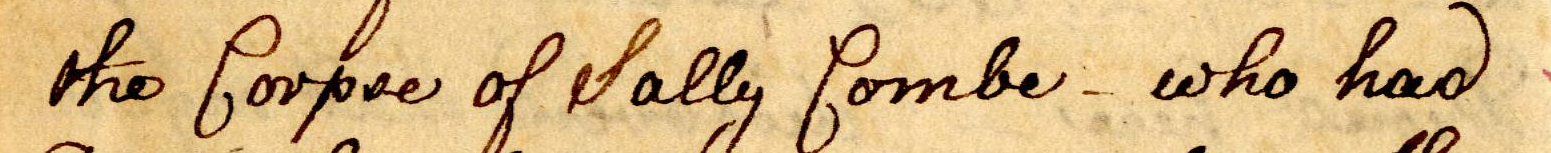the Corpse of Sally Combe- who had
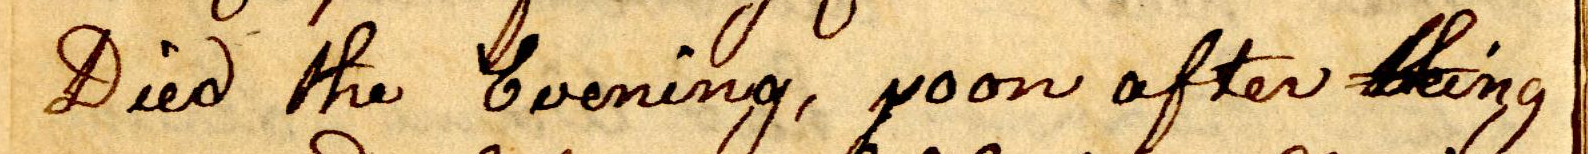Died the Evening, soon after [_]being
